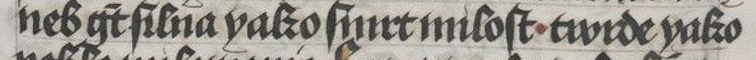neb ḡt ſilna yako ſmrt miloſt.twrde yako
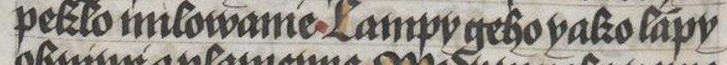peklo milowaníe.Lampy geho yako lāpy
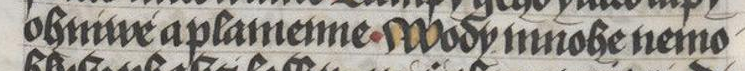ohníwé a plamenne.Wody mnohe nemo¬
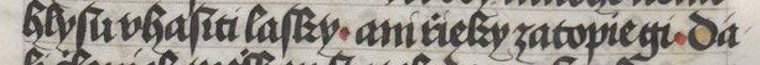hlyſu vhaſiti laſky.ani ṙieky zatopiegí.Da¬
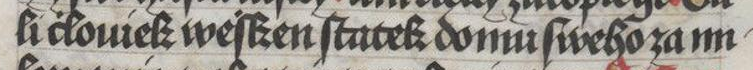li ċlouiek weẛken ſtatek domu ſweho za mi¬
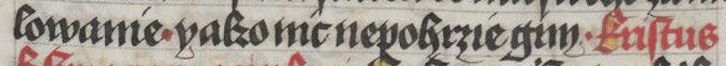lowanie.yako níc nepohrzíe gím.Kriſtus
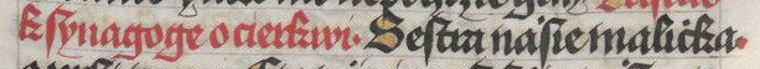kſynagoge o cierkwí.Seſtra naẛie maliċka.
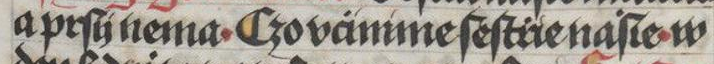a prſij nema.Czo vċiníme ſeſtṙie naẛíe.w
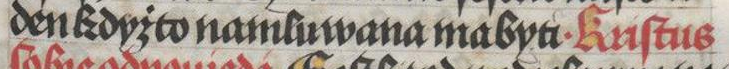den kdyżto namluwana mabyti.Kriſtus
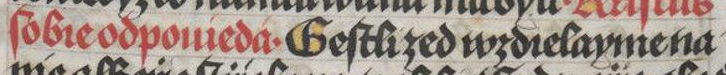ſobie odpouíedá.Geſtli zed wzdielayme na¬
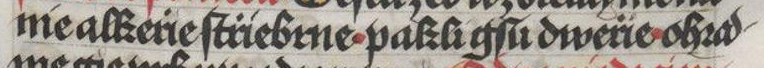níe alkeṙie ſtṙíebrne.pakli gſú dweṙie.ohrad¬
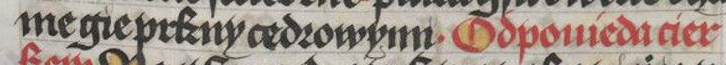me gie prkny cedrowymi.Odpouíeda cíer¬
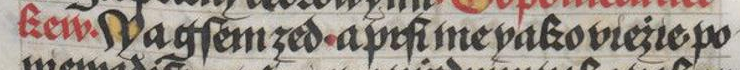kew.Ya gſem zed.a prſí me yako vieżie.po¬
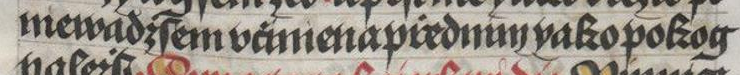niewadżſem vċiniena pṙedním yako pokog
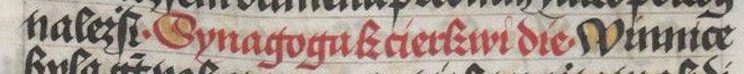nalezẛi.Synagoga kcíerkwi díe.Vinnice
